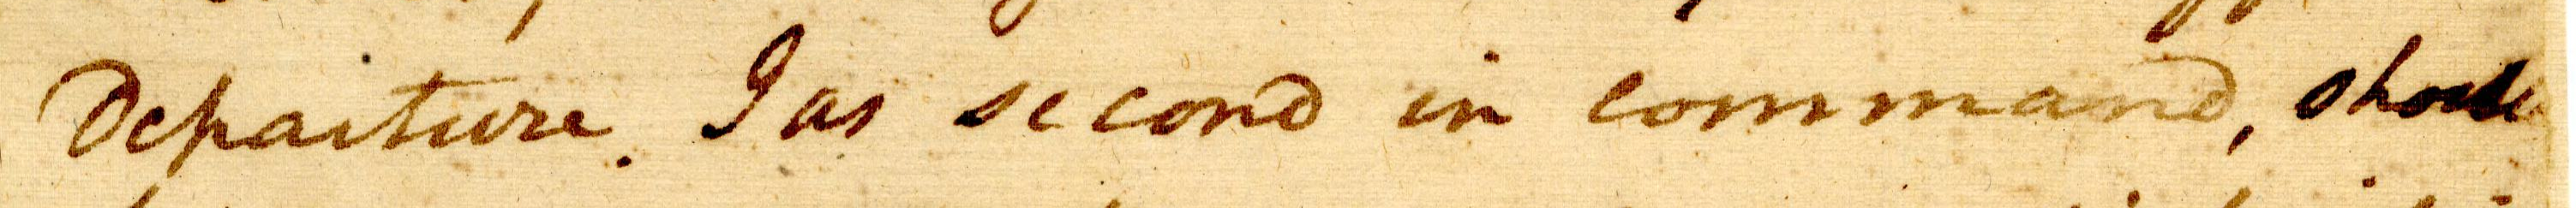departure. I as second in command, should
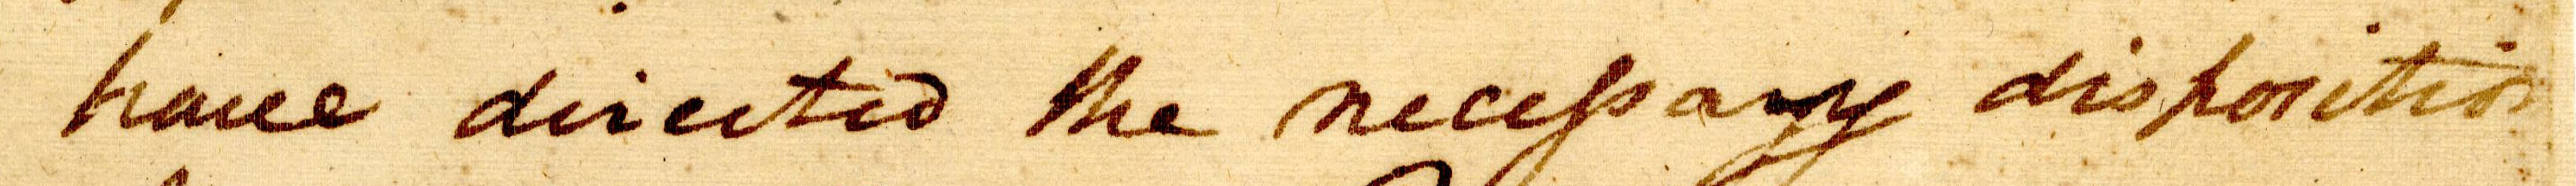have directed the necessary disposition
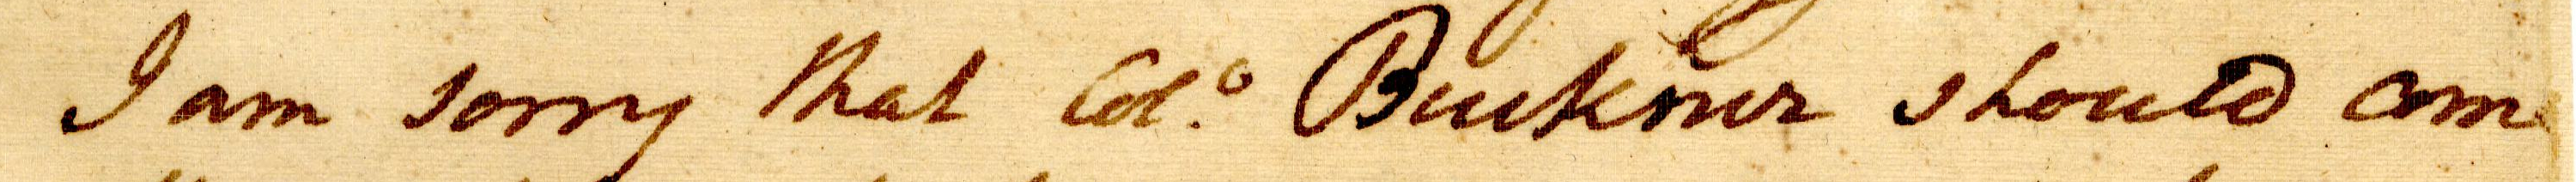I am sorry that Col^o. Buckner should on
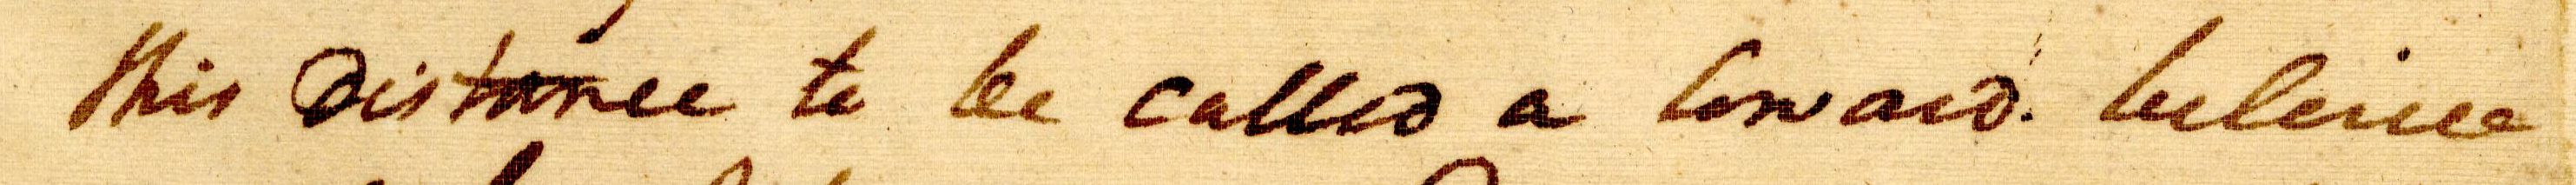this distance to be called a Coward believe
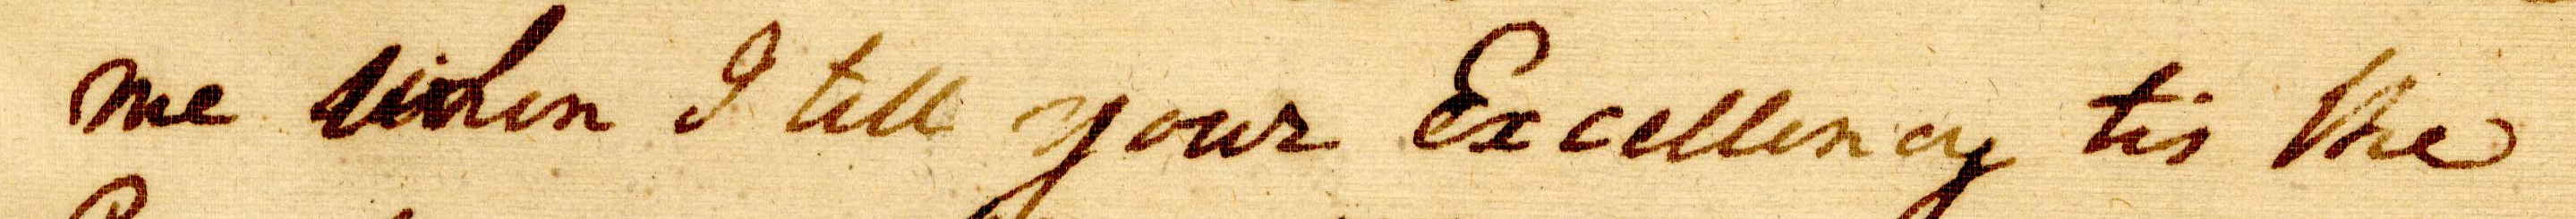me when I tell your Excellency tis the
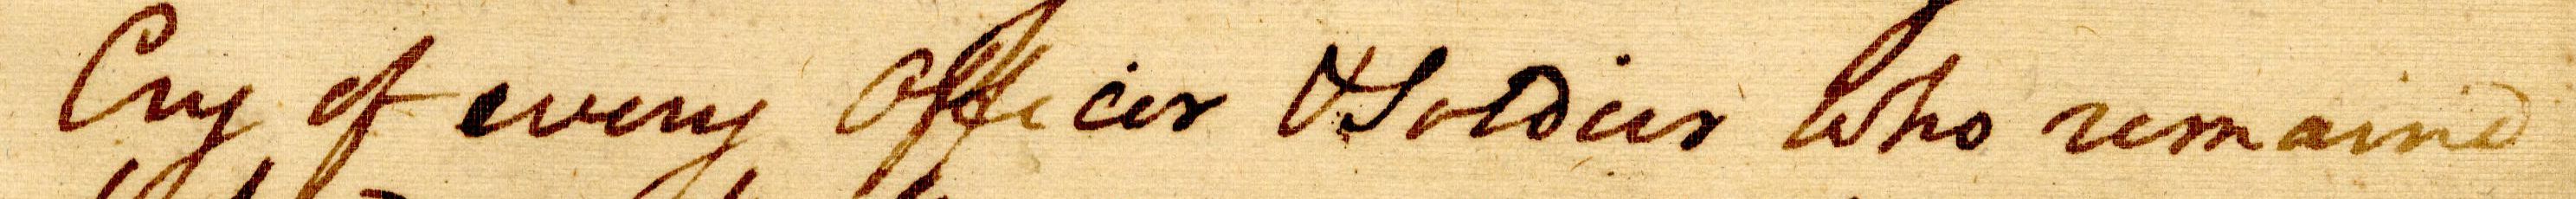Cry of every Officer & Soldier who remaind
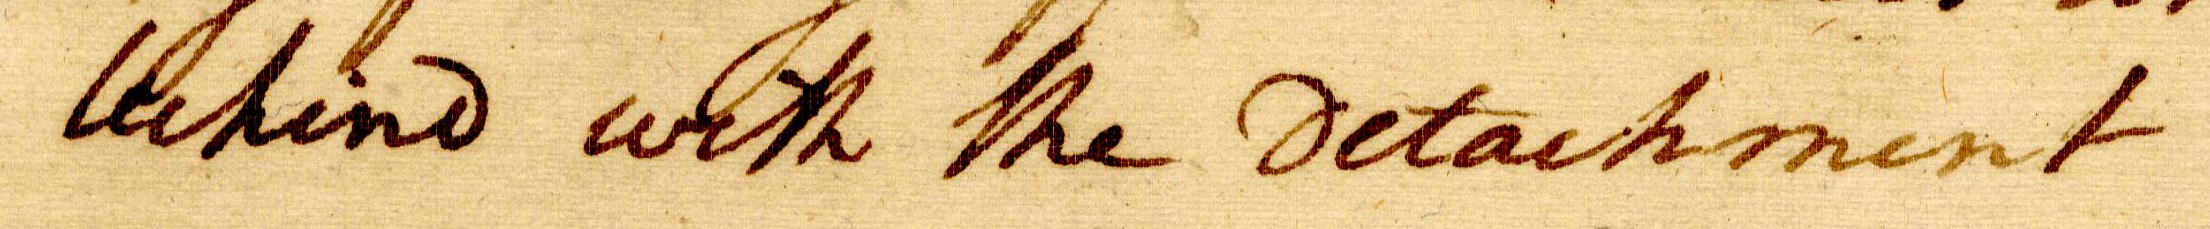behind with the detachment
